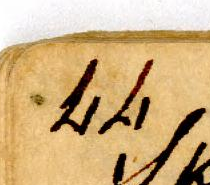44
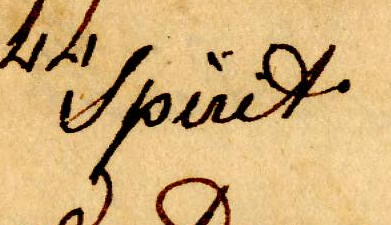Spirit
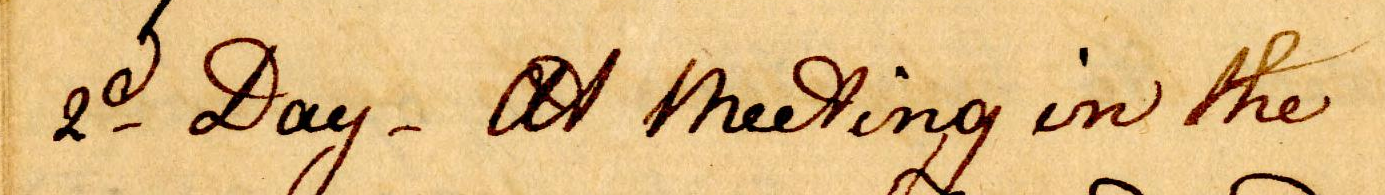2^d Day- At meeting in the
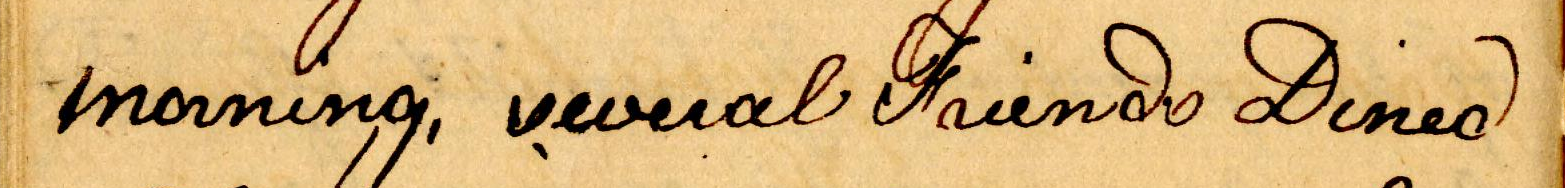morning, several Friends Dined
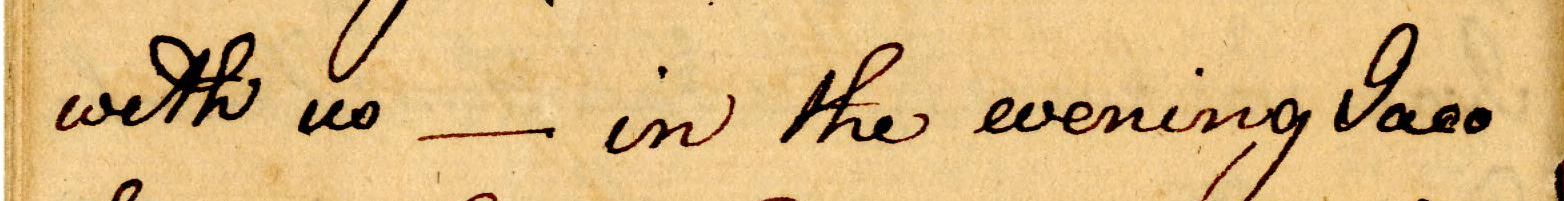with us- in the evening aco
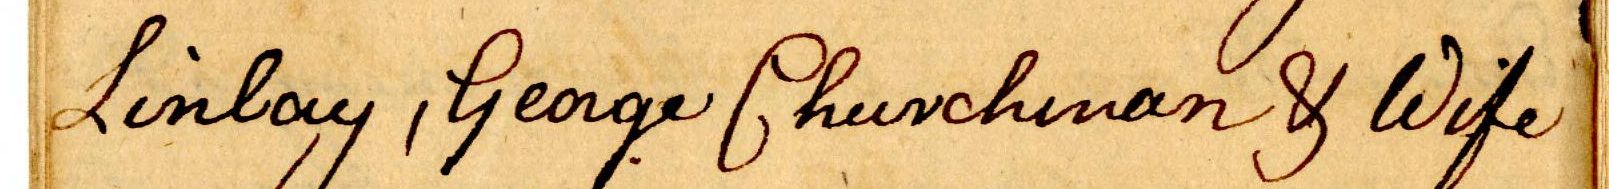Linlay, George Churchman & Wife
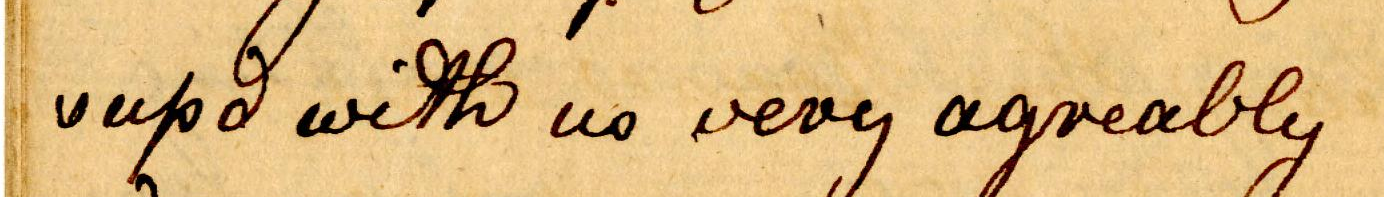supd with us very agreably
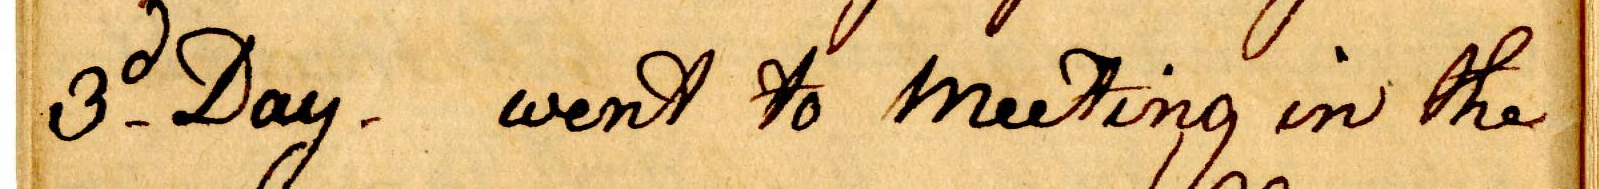3^d Day. went to Meeting in the
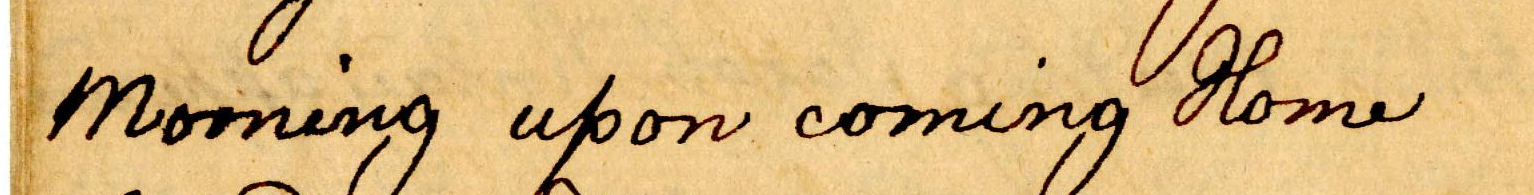Morning upon coming Home
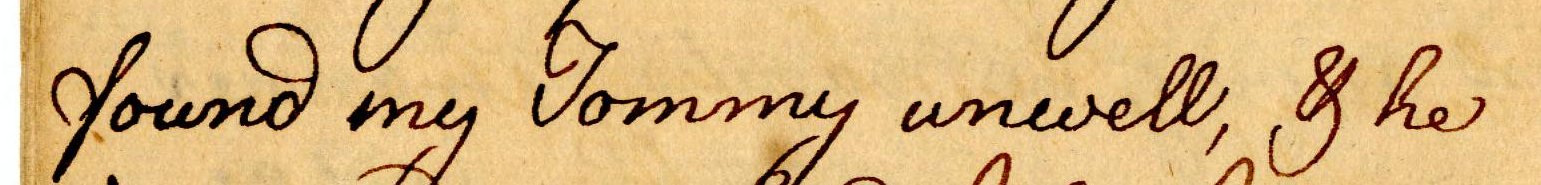found my Tommy unwell, & he
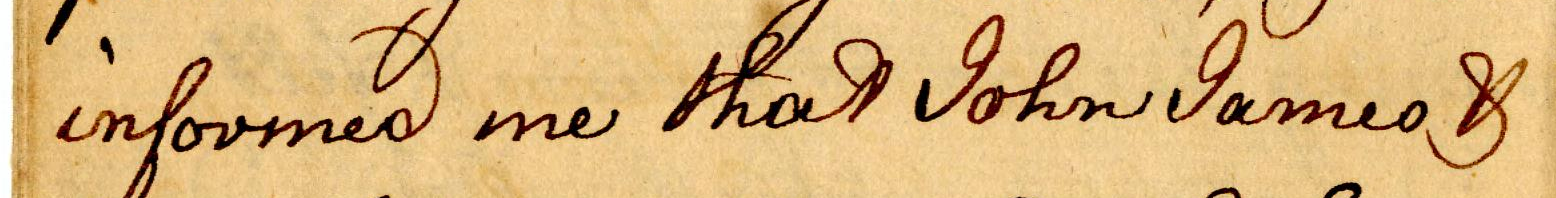informed me that John James &
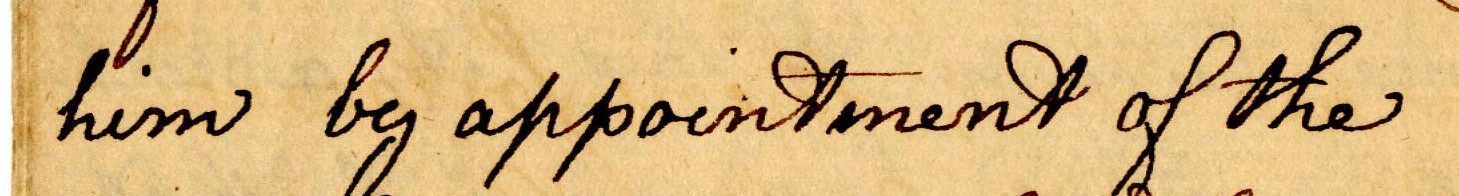him by appointment of the
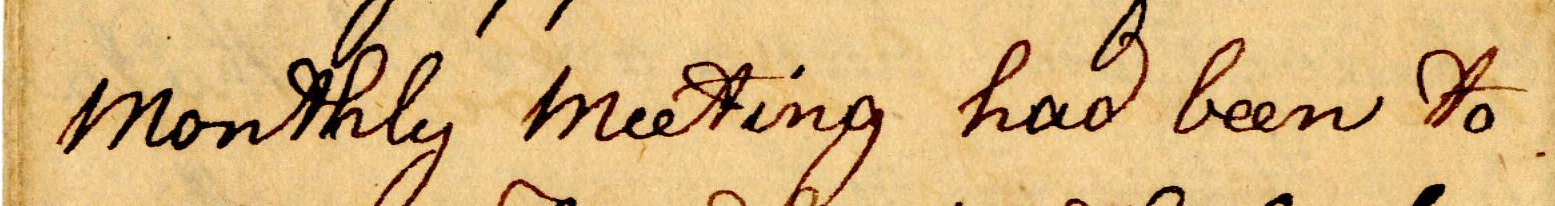Monthly Meeting had been to
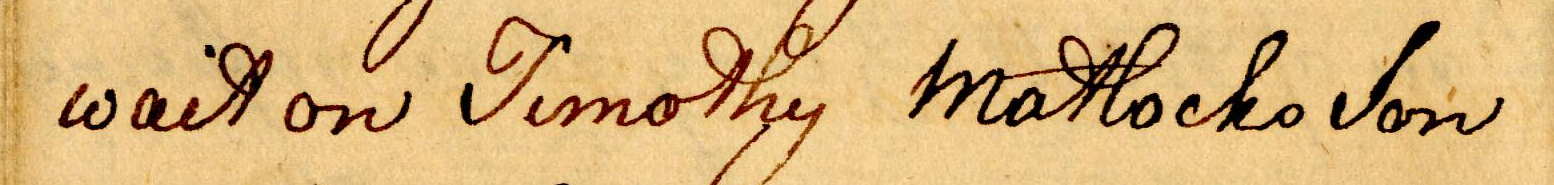wait on Timothy Matlocks Son
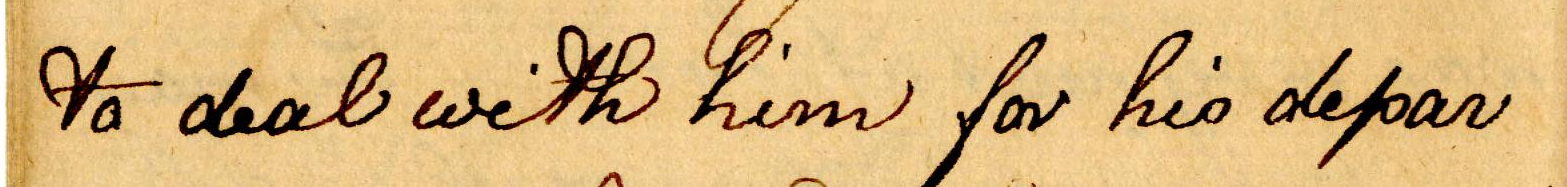to deal with him for his depar
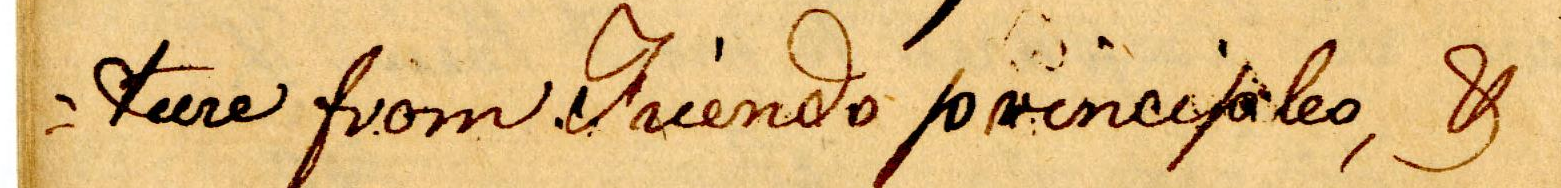-ture from Friends principles, &
